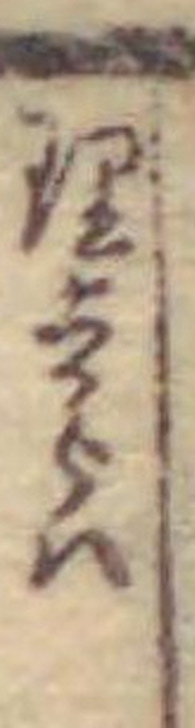理太郎は
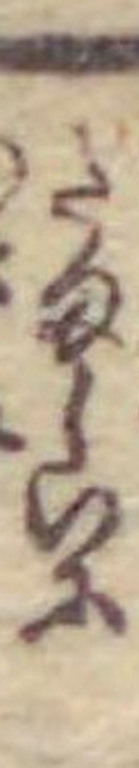たましいに
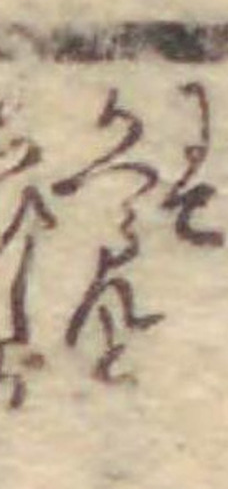かへらんと
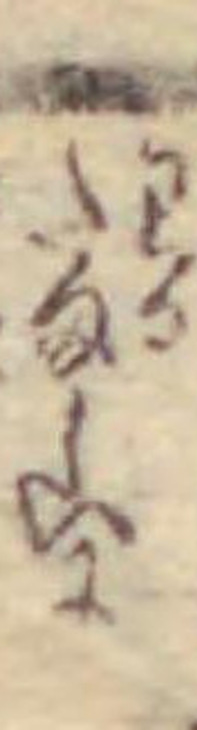たましいに
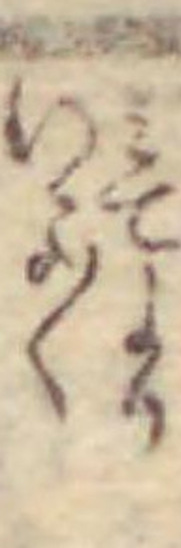いよ〳〵
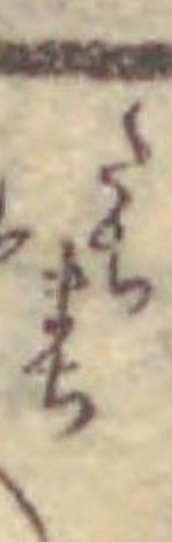たちまち
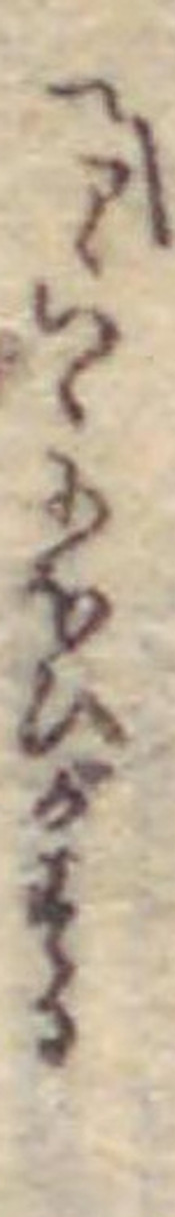〽アヽいゝにほひがする
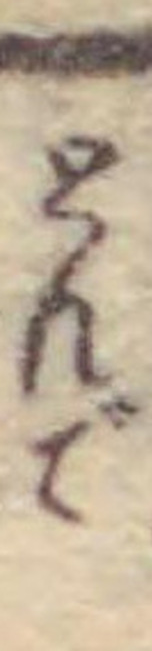とんで
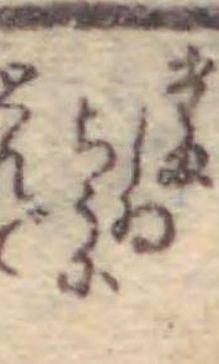とんで
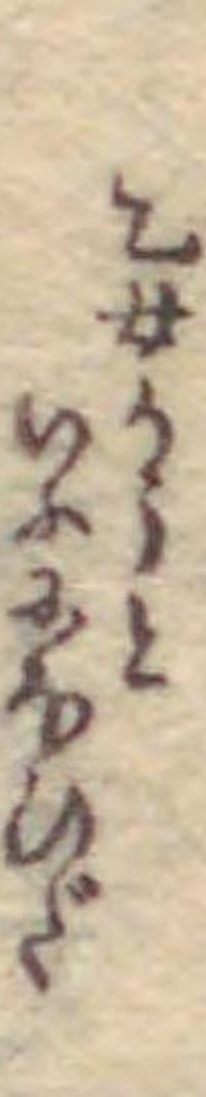いふにほひだ
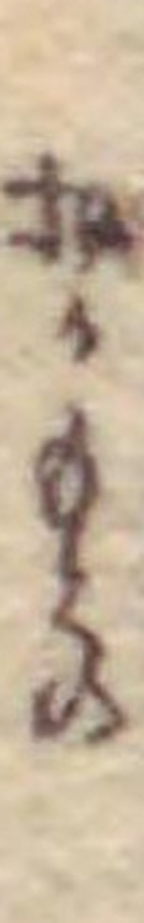おかもとの
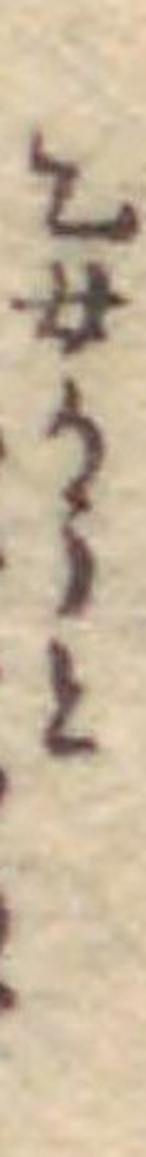乙女からと
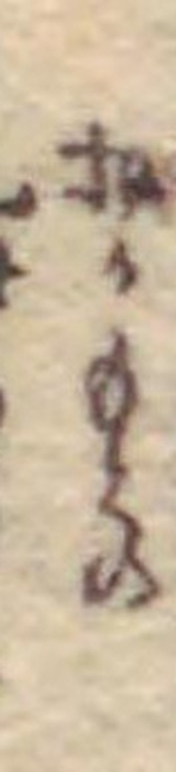おかもとの
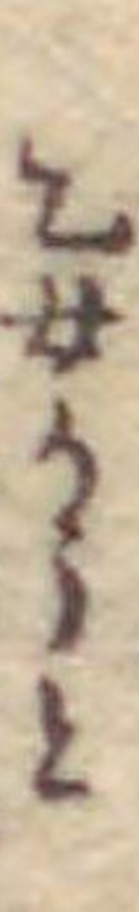乙女からと
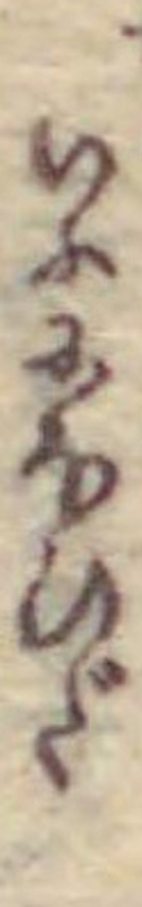いふにほひだ
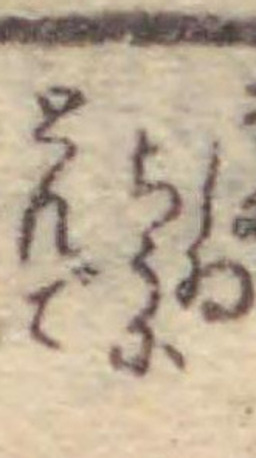ちうに
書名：心学早染艸 : 3巻
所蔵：国立国会図書館 National Diet Library, JAPAN
